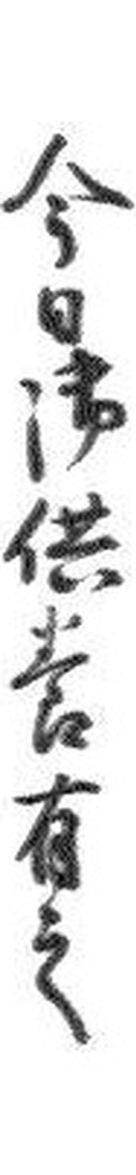今日御供養有之
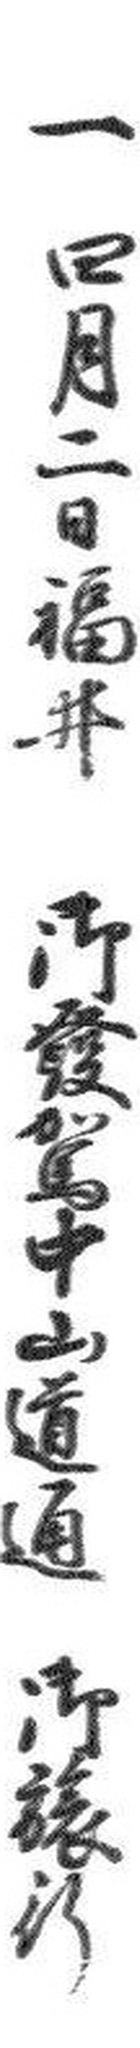一四月二日福井御発駕中山道通御旅行
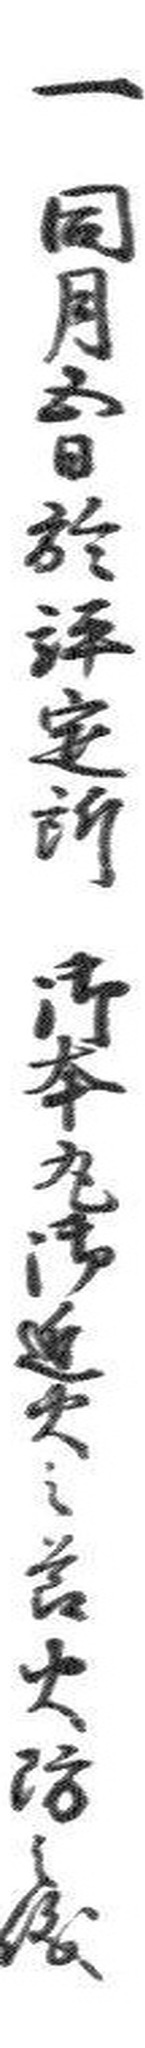一同月五日於評定所御本丸御近火之節火防之儀
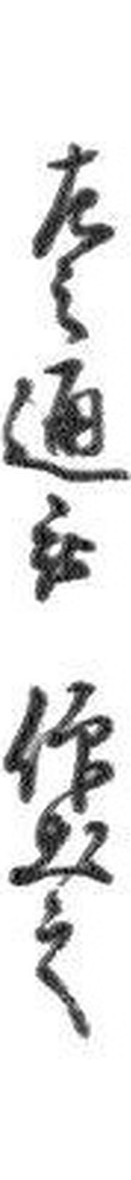左之通被仰出之
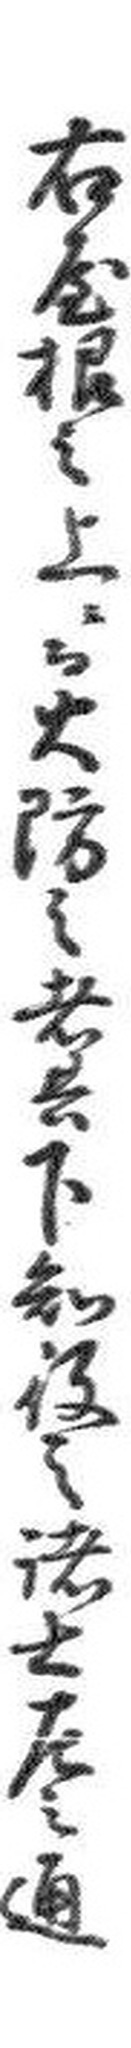右屋根之上ニ而火防之者共下知役之諸士左之通
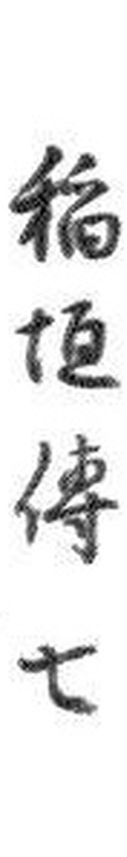稲垣伝七

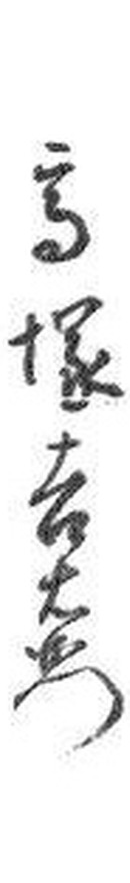高塚吉右衛門
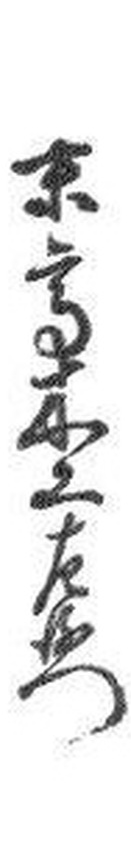末高木工左衛門
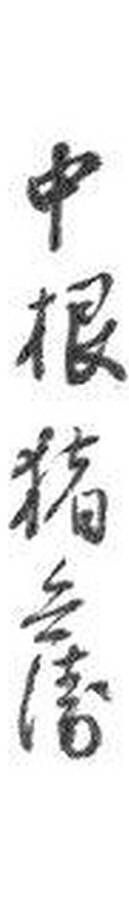中根猪兵衛
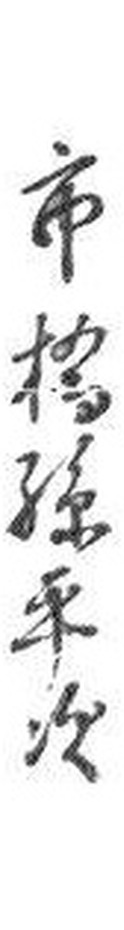市橋孫平次
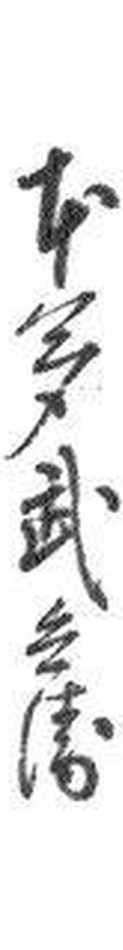本多武兵衛
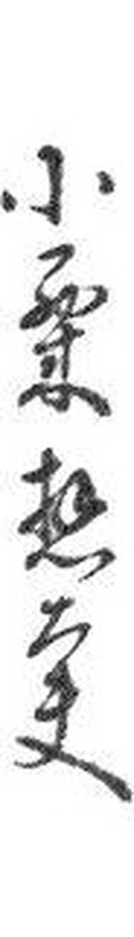小栗惣大夫
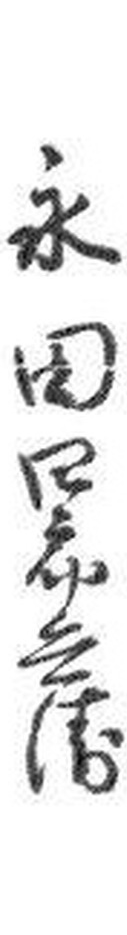永田四郎兵衛
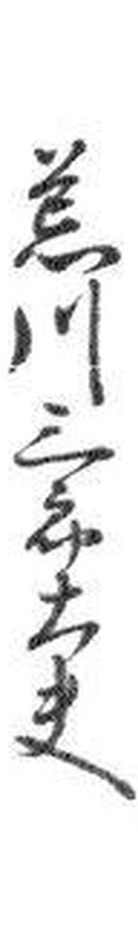荒川三郎大夫
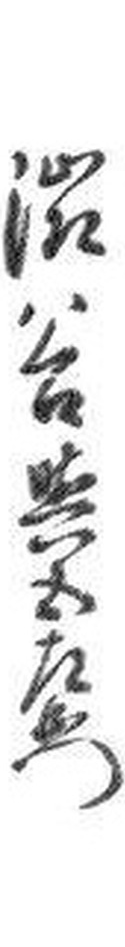渋谷与五左衛門
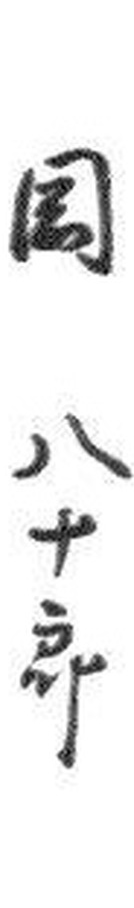岡八十郎
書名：家譜 八 光通公 従寛文十年到同十二年
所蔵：福井県文書館 Fukui Prefectural Archives
